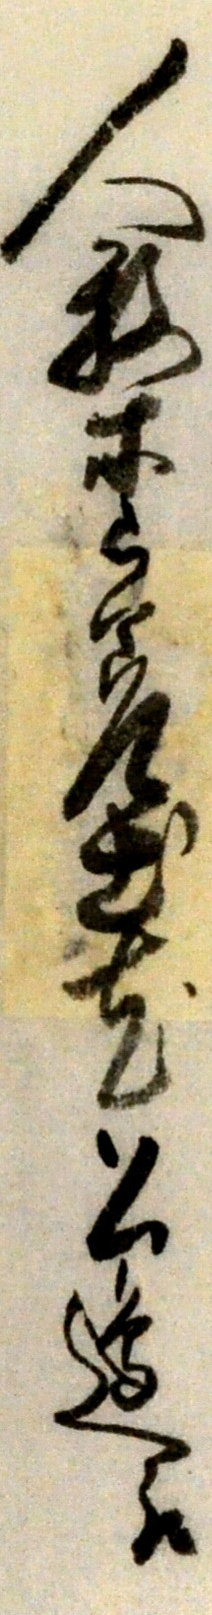人数等被差出尤公辺え
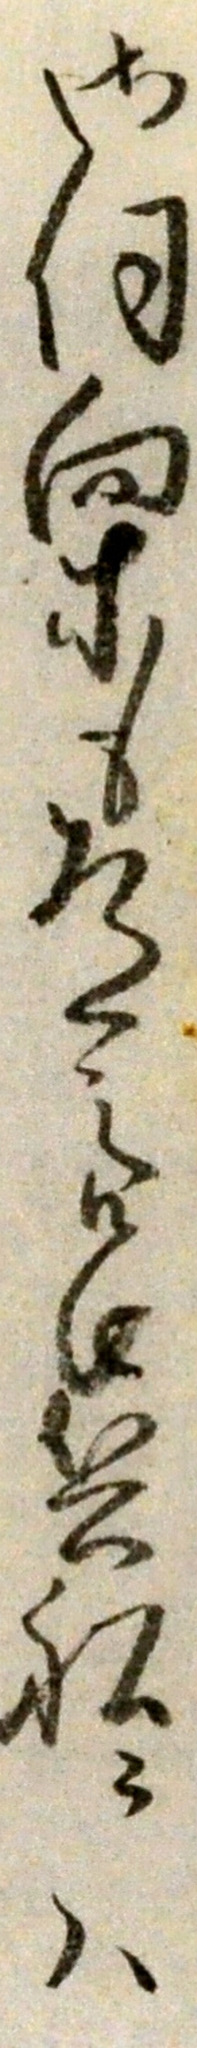御伺向も有之候由兵船には
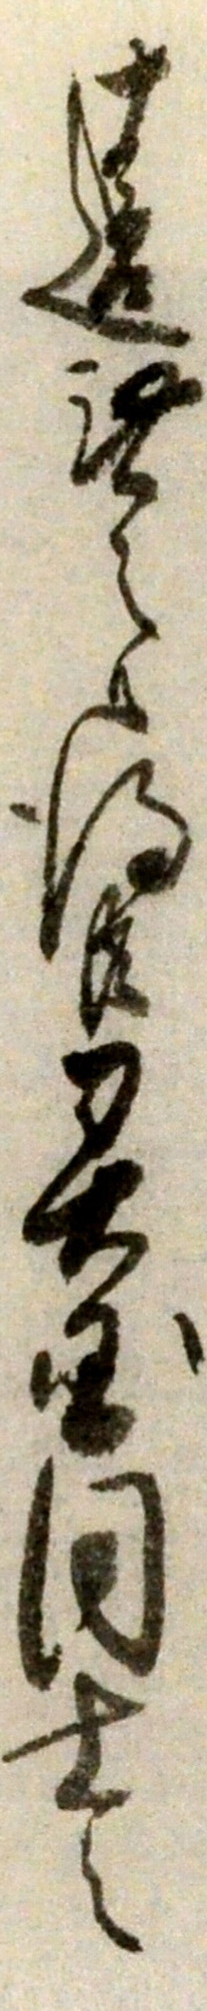違無之候得共異国同士之
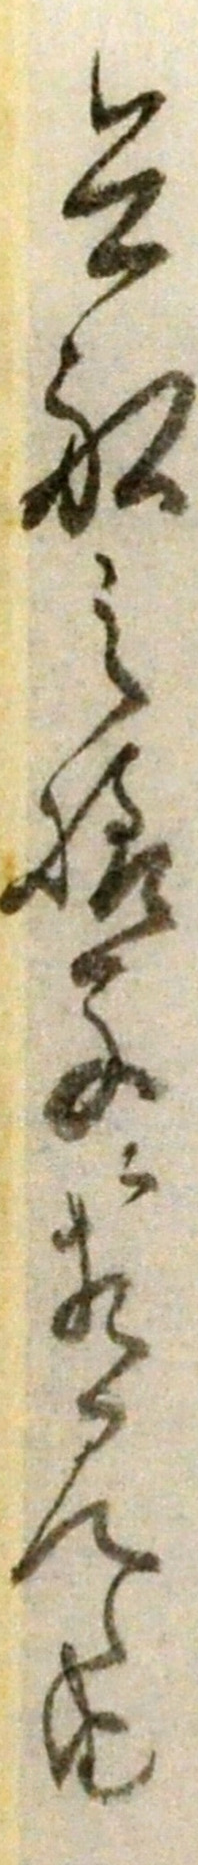兵船之様子に相見候由
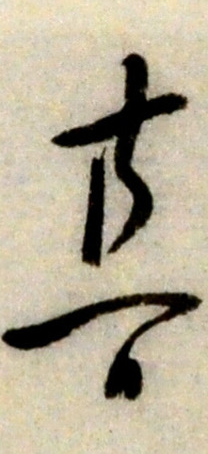廿一日
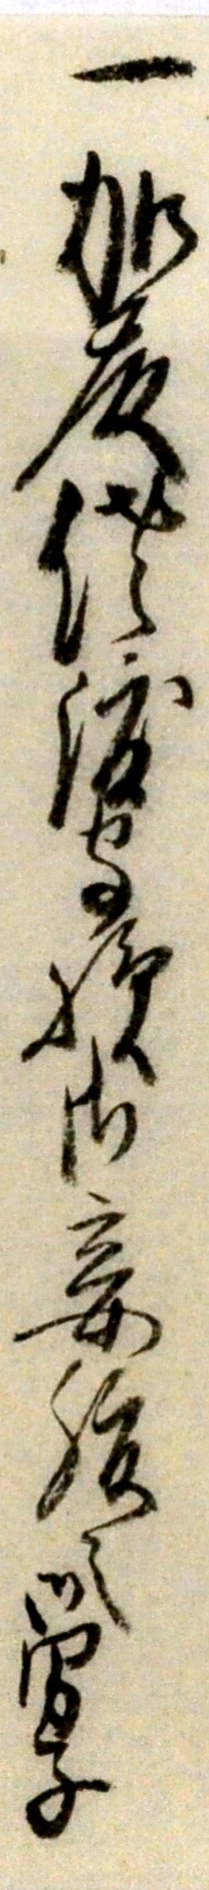一加藤佐渡守様御妾腹之御男子
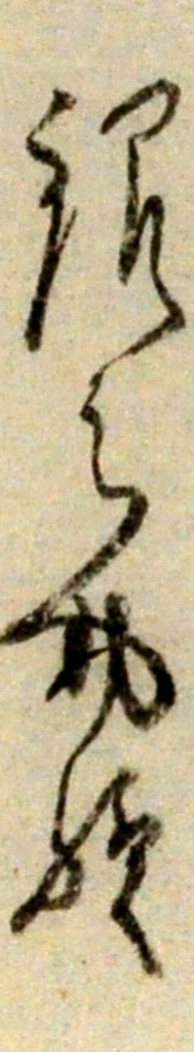銀之助様
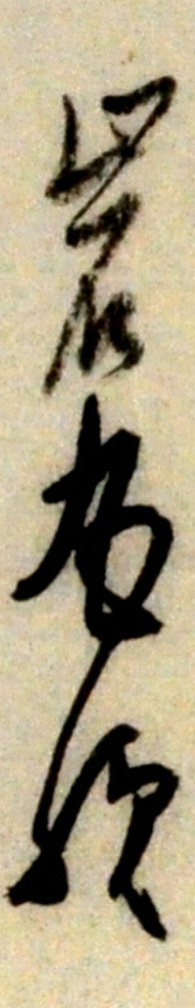岩丸様
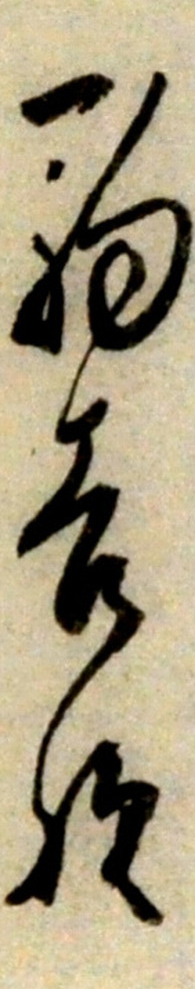駒吉様
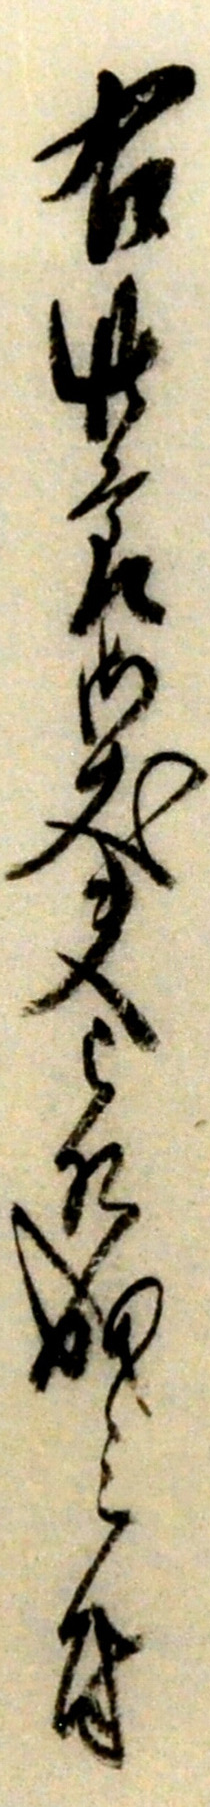右此節御丈夫被相成候に付
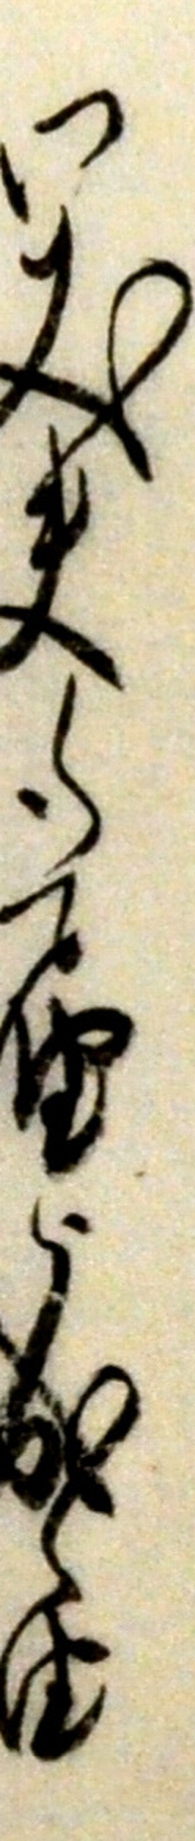御丈夫御届被成候由

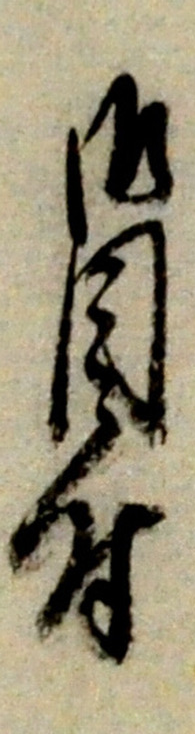御目付
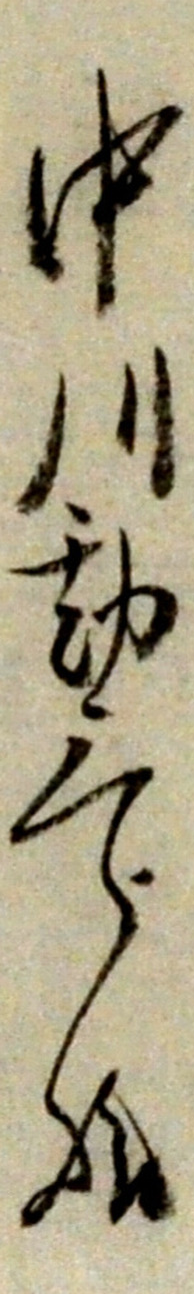中川勘三郎様
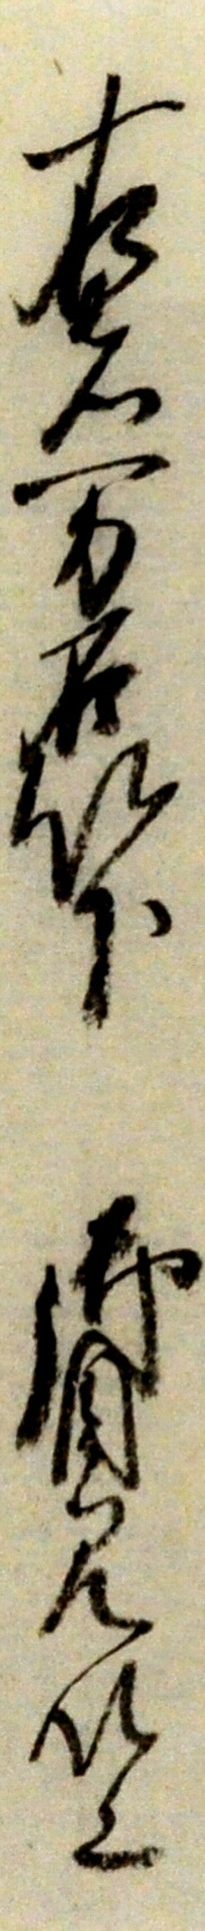右は万石以下御目見以上
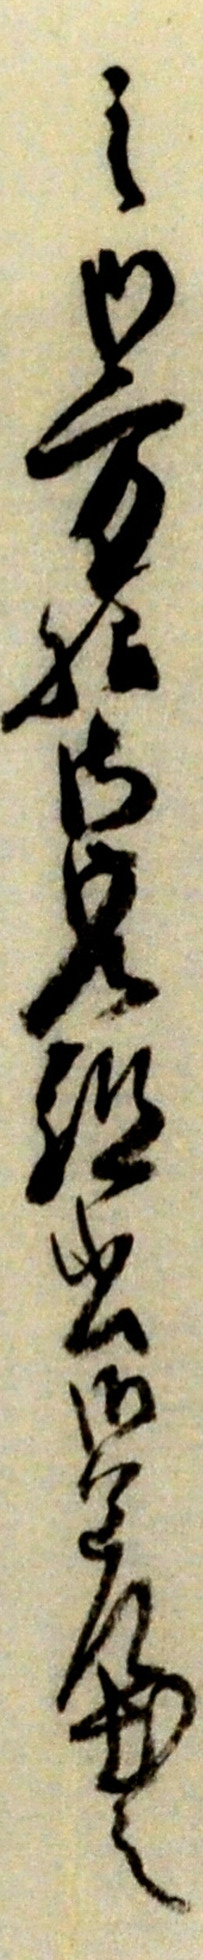之御方様御先組書御差出之
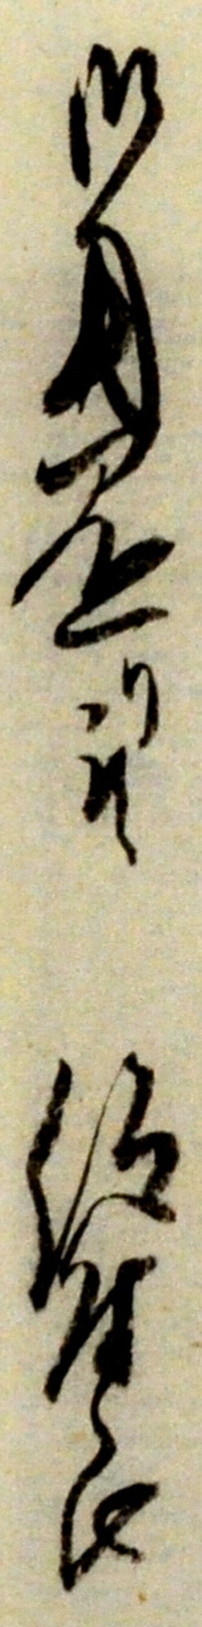御用懸り被仰出候由
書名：申合帳〔一括〕
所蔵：伊那市立高遠町図書館・合同会社AMANE
